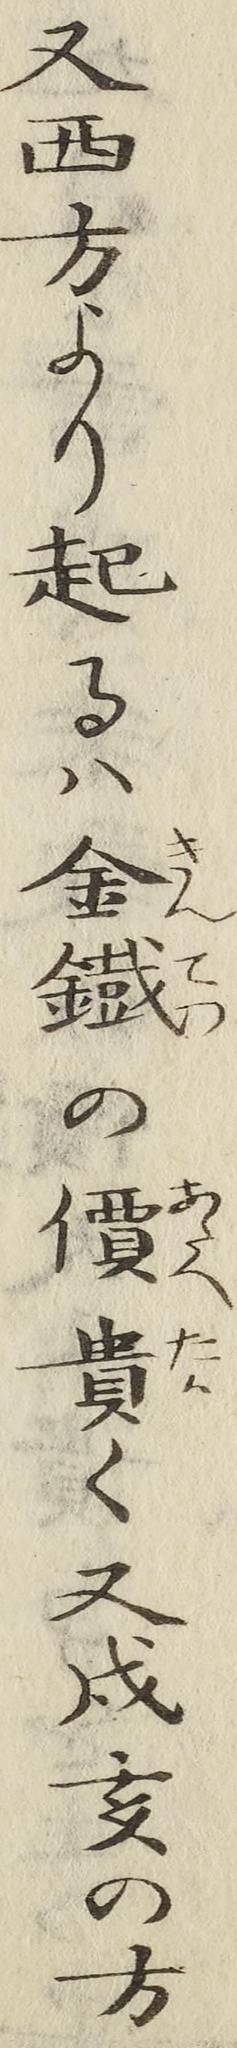又西方より起るは金鉄の価貴く又亥の方
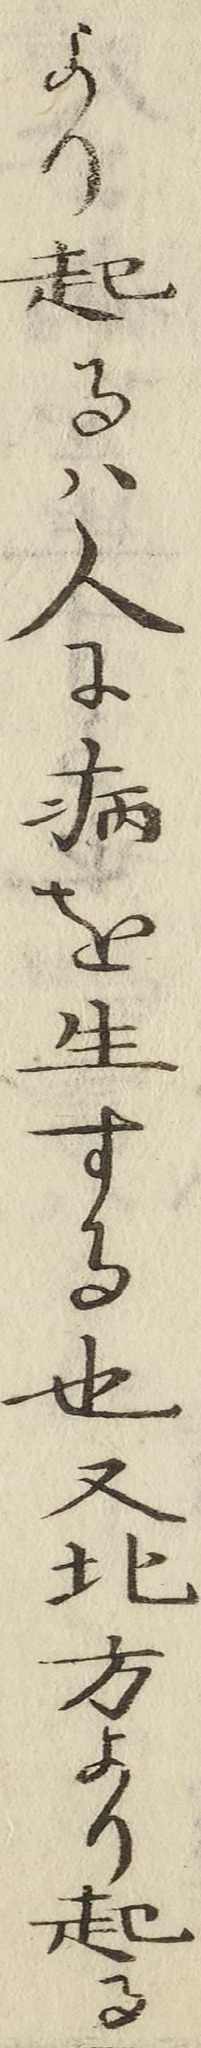より起るは人に病を生する也又北方より起る
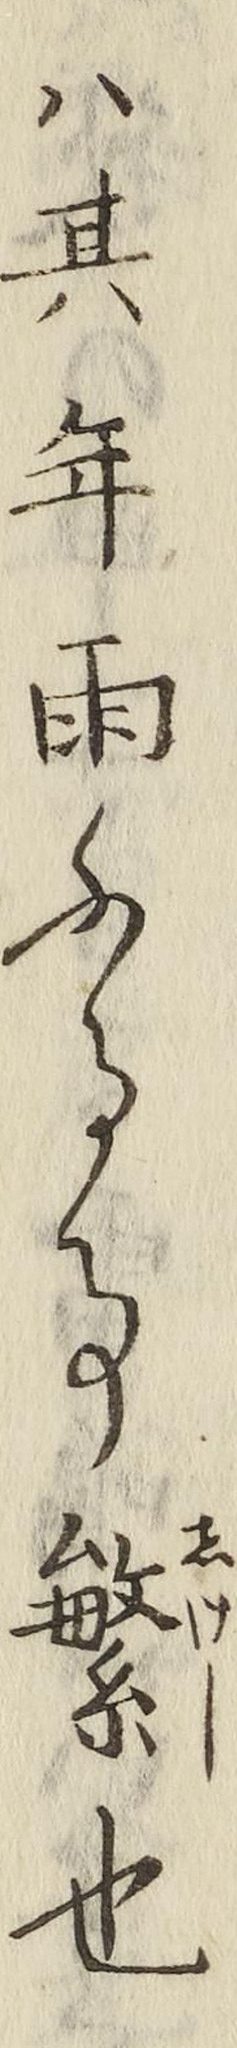は其年雨ふる事繁也
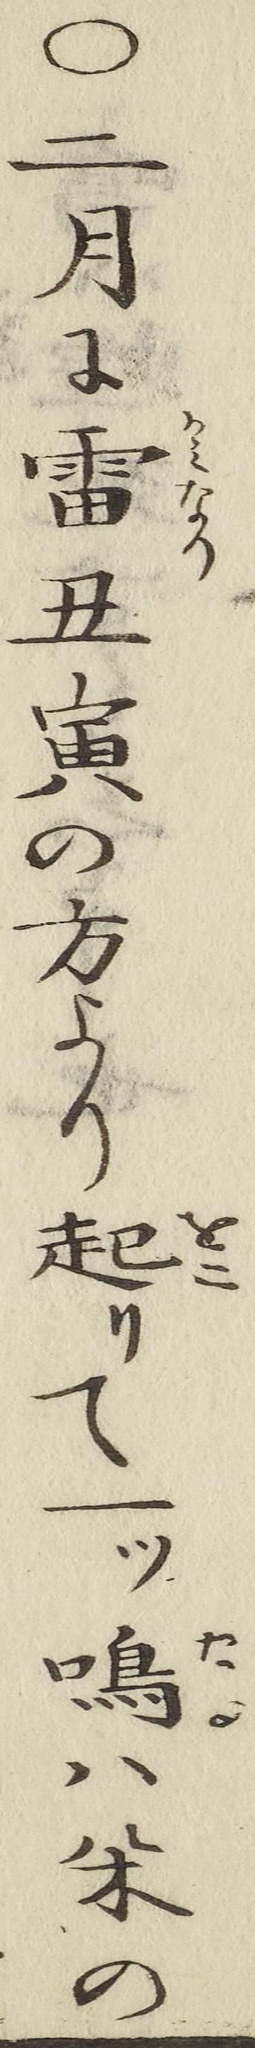○二月に雷丑寅の方より起りて一ッ鳴は米の
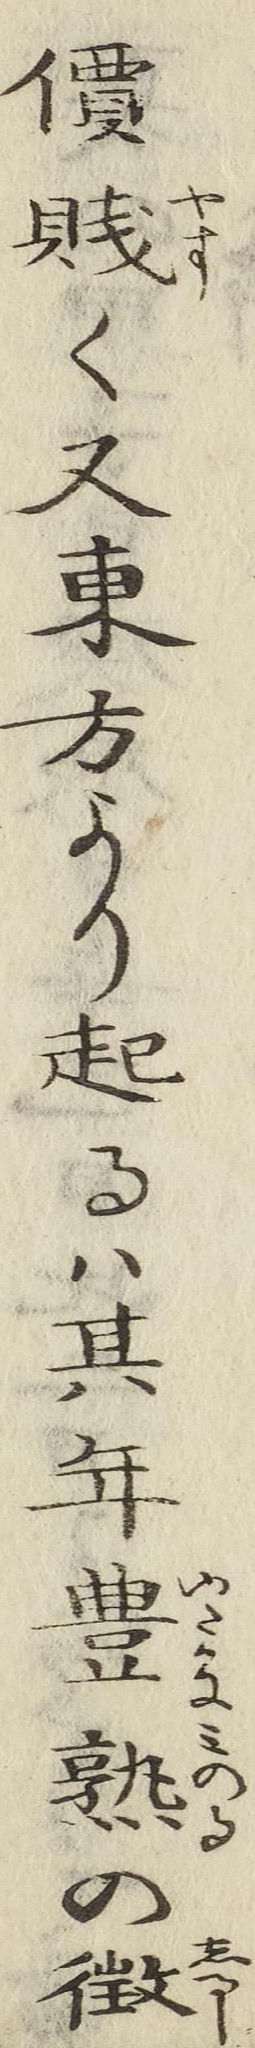価賤く又東方より起るは其年豊熟の徴
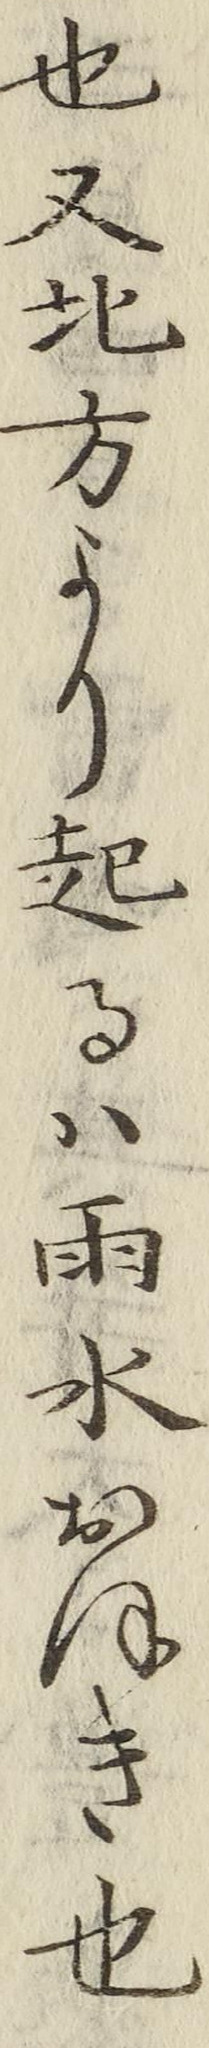也又北方より起るは雨水おほき也
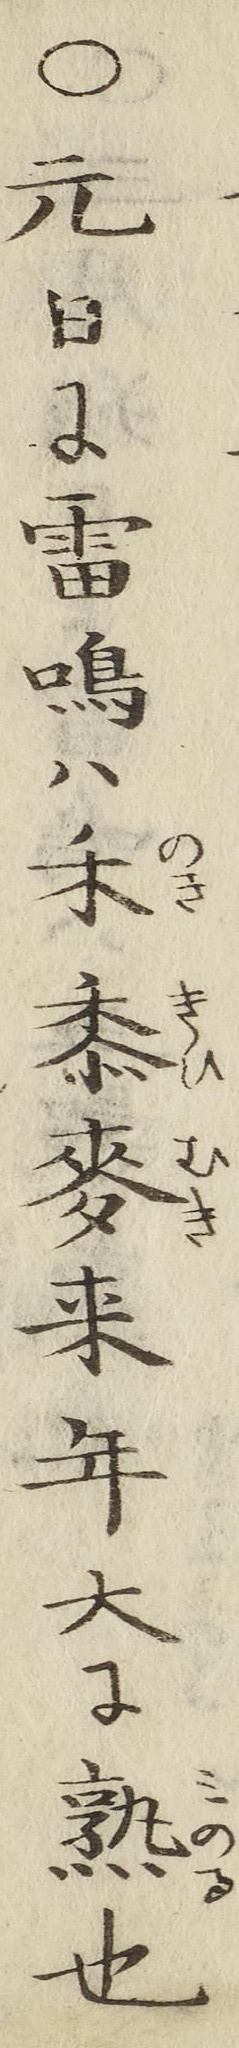○元日に雷鳴は禾黍麦来年大に熟なり
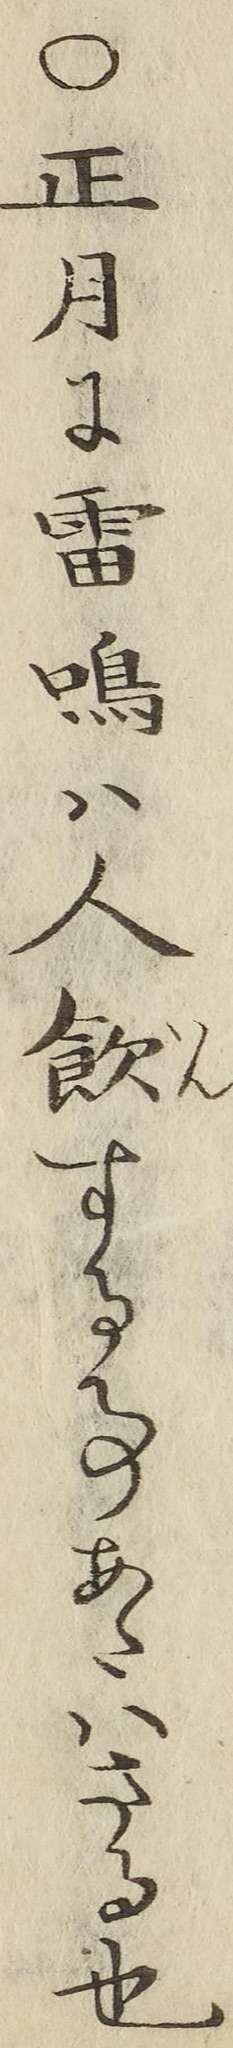○正月に雷鳴は人飲する事あたはさる也

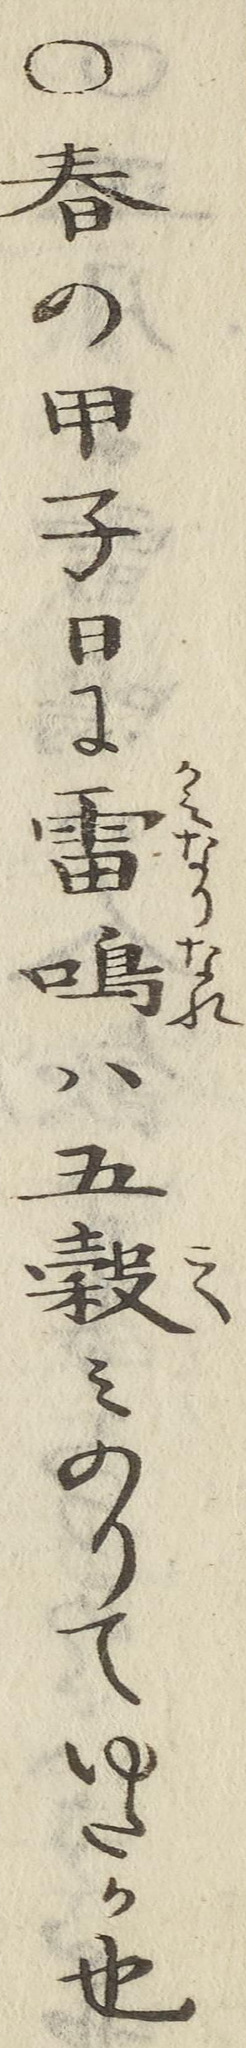○春の甲子日に雷鳴は五穀みのりてゆたか也
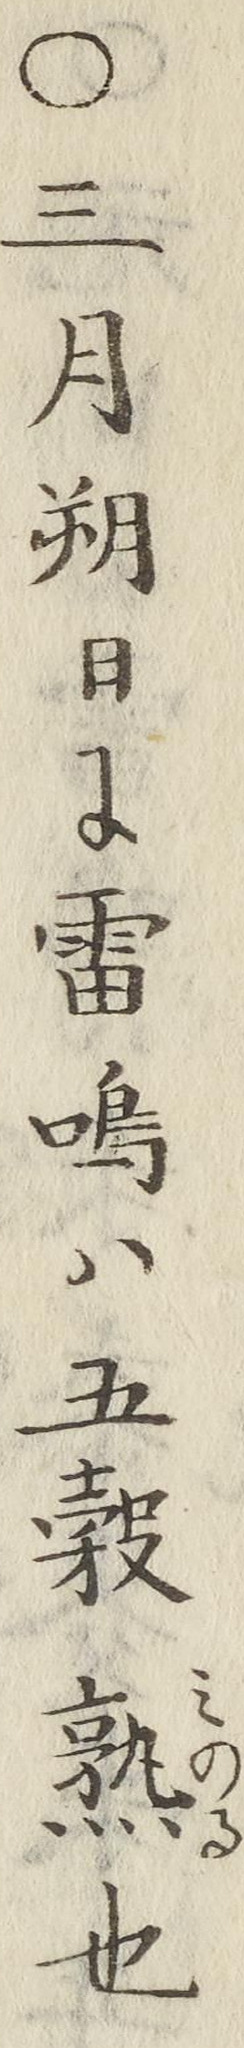○三月朔日に雷鳴は五穀熟也
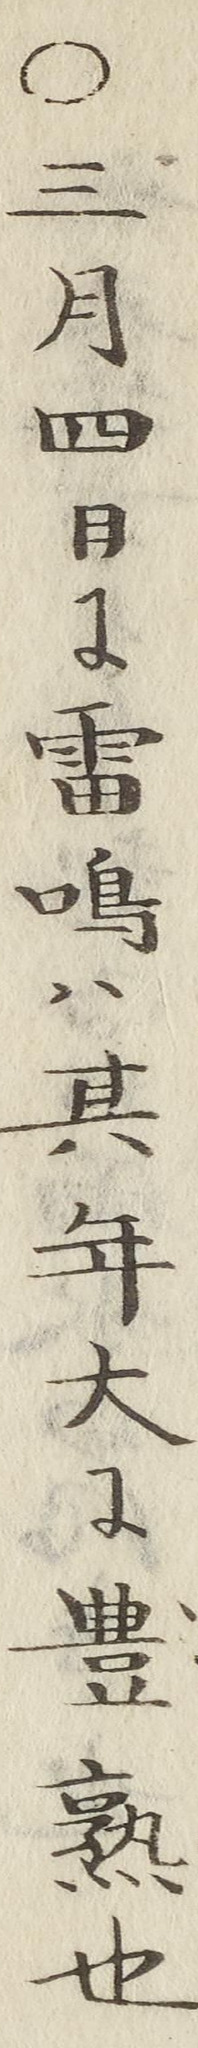○三月四日に雷鳴は其年大に豊熟也
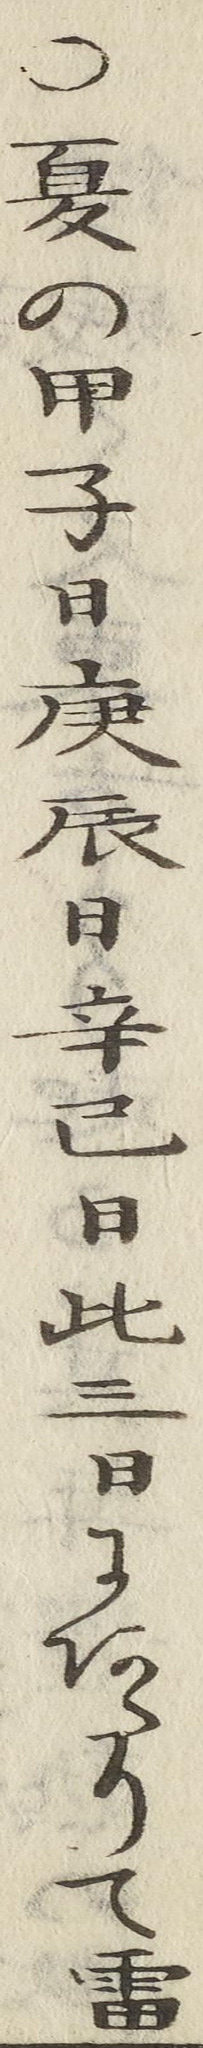○夏の甲子日庚辰日辛巳日此三日にあたりて雷
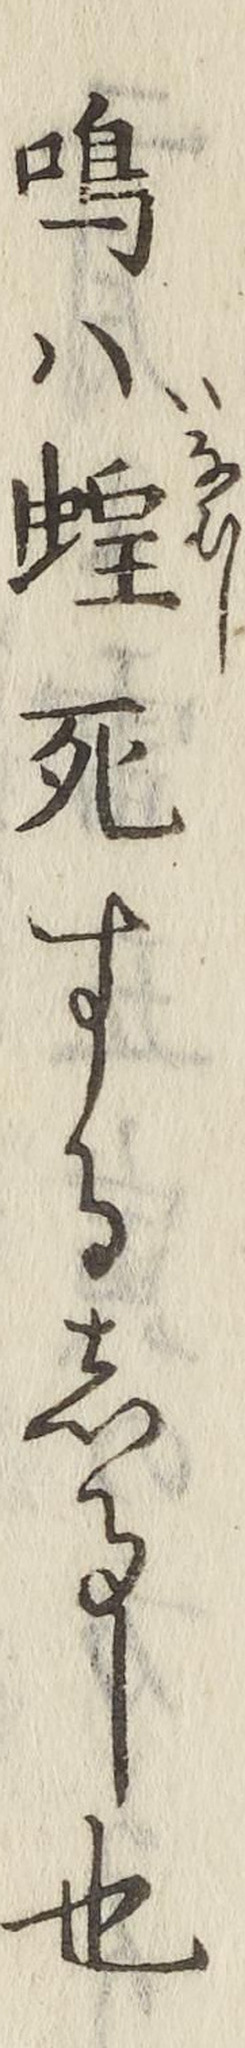鳴は蝗死するしるし也
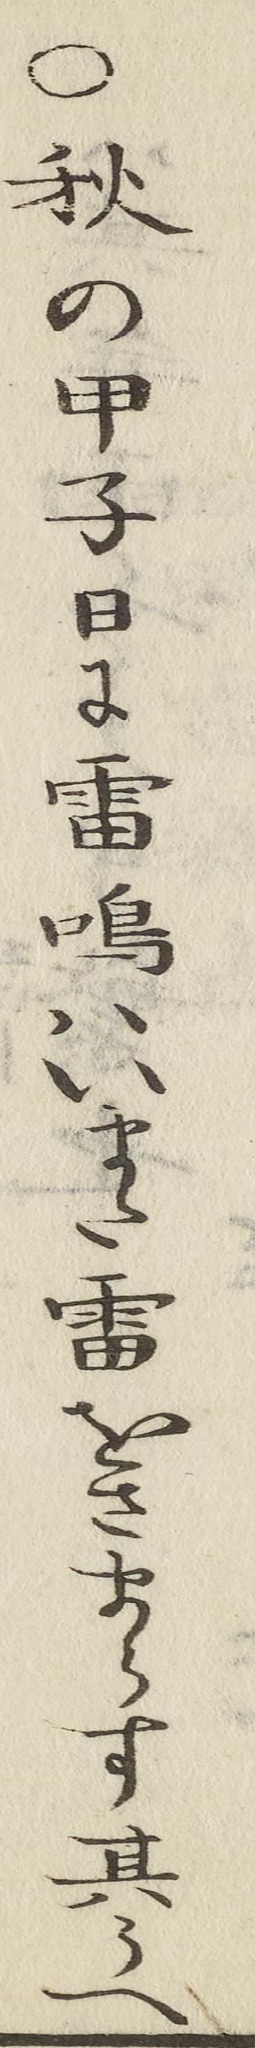○秋の甲子日に雷鳴はいまた雷をさまらす其うへ
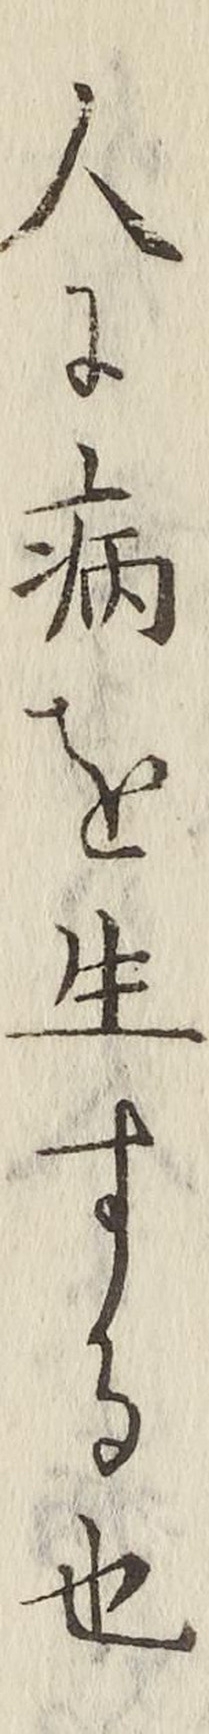人に病を生する也
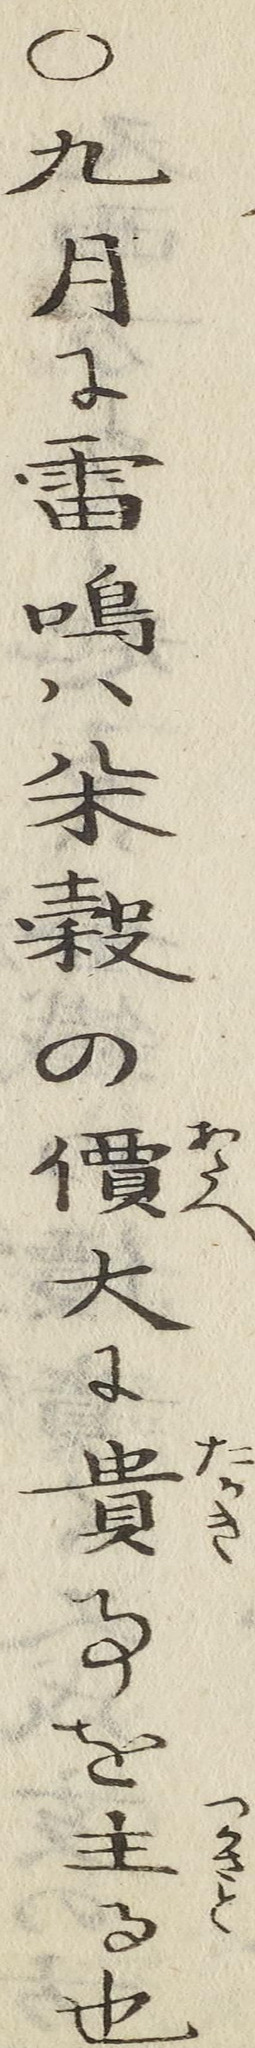○九月に雷鳴は米穀の価大に貴事を主る也
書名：天時占候　二
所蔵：東京大学地震研究所図書室 Earthquake Research Institute Library, The University of Tokyo, JAPAN
